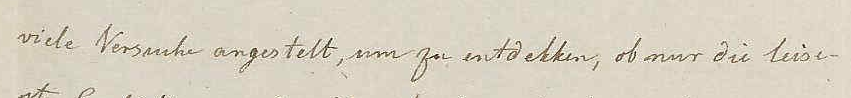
viele Versuche angestelt, um zu entdekken, ob nur die leise-
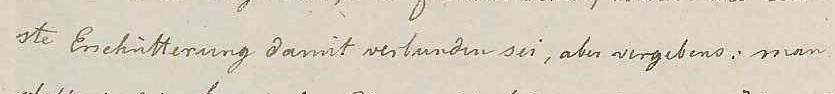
ste Erschütterung damit verbunden sei, aber vergebens: man
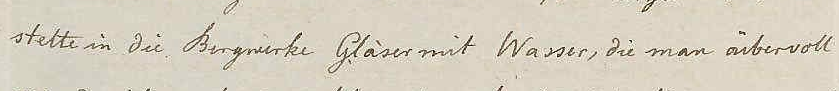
stelte in die Bergwerke Gläser mit Wasser, die man übervoll
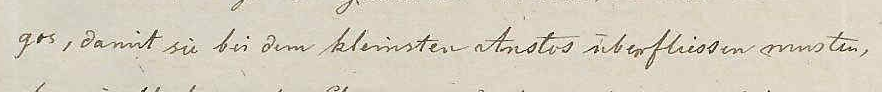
gos, damit sie bei dem kleinsten Anstos überfliessen musten,
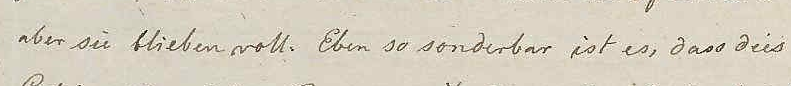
aber sie blieben voll. Eben so sonderbar ist es, dass dies
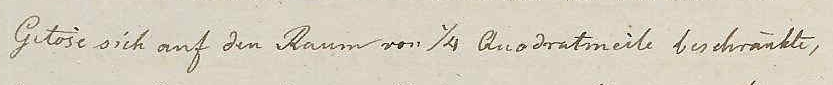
Getöse sich auf den Raum von ¼ Quadratmeile beschränkte,
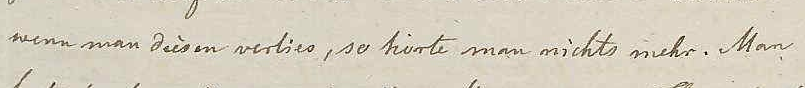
wenn man diesen verlies, so hörte man nichts mehr. Man
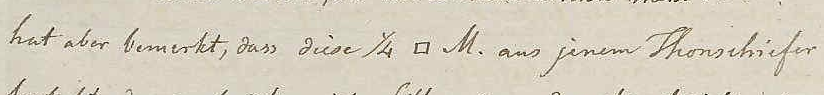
hat aber bemerkt, dass diese ¼ □ M. aus jenem Thonschiefer
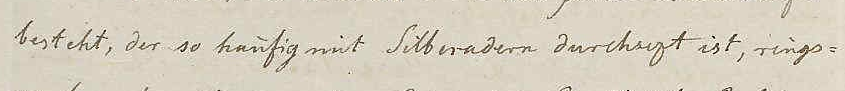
besteht, der so häufig mit Silberadern durchsezt ist, rings-
